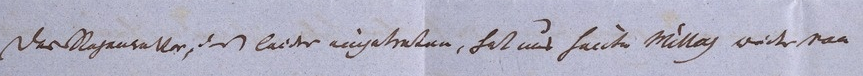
Das Regenwetter, das leider eingetreten, hat uns heute Mittag wieder von
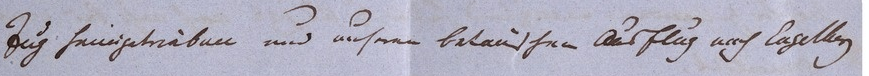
Zug heimgetrieben und unseren botanischen Ausflug nach Engelberg
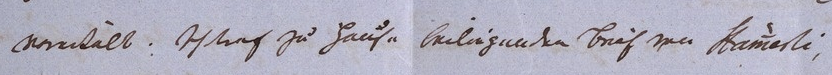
vereitelt. Ich traf zu Hause beiliegenden Brief von Hämmerli,
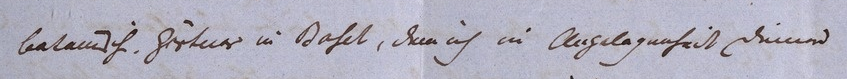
botanisch. Gärtner in Basel, dem ich in Angelegenheit Deiner
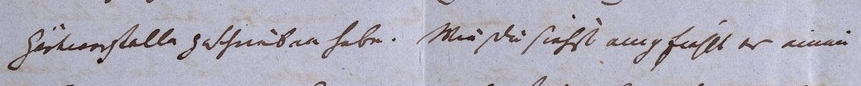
Gärtnerstelle geschrieben habe. Wie Du siehst empfiehlt er einen
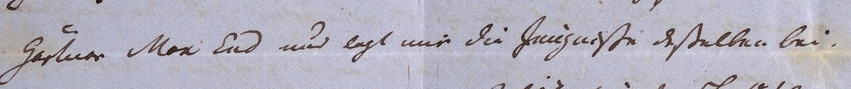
Gärtner Max End und legt mir die Zeugniße deßelben bei.
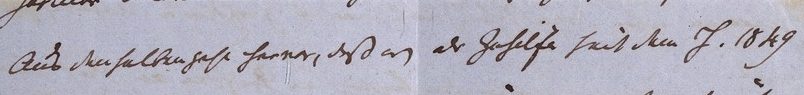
Aus denselben geht hervor, daß er als Gehilfe seit dem J. 1849
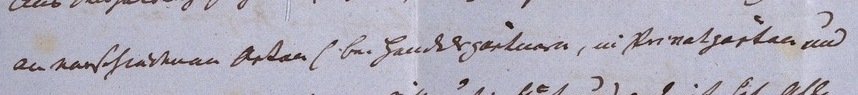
an verschiedenen Orten (bei Handelsgärtnern, in Privatgärten und
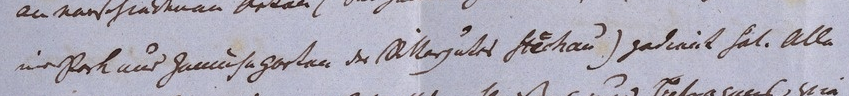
im Park und Gemüsegarten des Rittergutes Stechau ) gedient hat. Alle
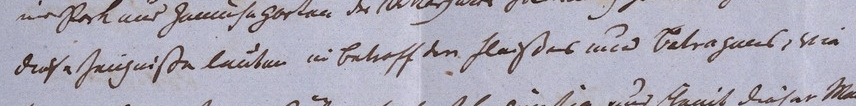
diese Zeugnisse lauten in Betreff des Fleißes und Betragens, wie
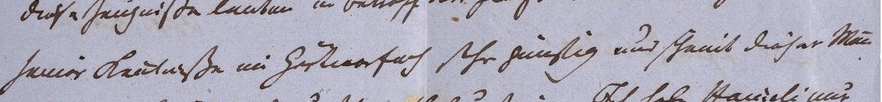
seiner Kenntniße im Gärtnerfach sehr günstig und scheint dieser Mann
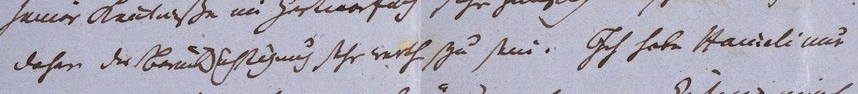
daher der Berücksichtigung sehr werth zu sein. Ich habe Hämmerli nur
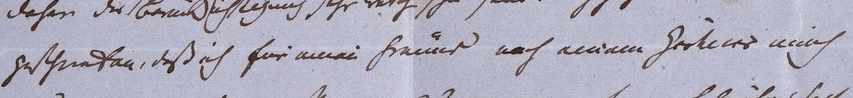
geschrieben, daß ich für einen Freund nach einem Gärtner mich
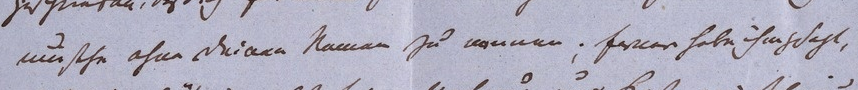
umsehe ohne Deinen Namen zu nennen; ferner habe ihm gesagt,
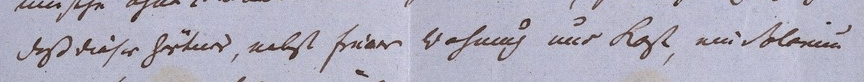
daß dieser Gärtner nebst freier Wohnung und Kost, ein Salarium
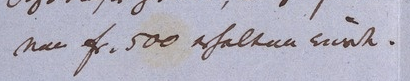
von Fr. 500 erhalten würde.
